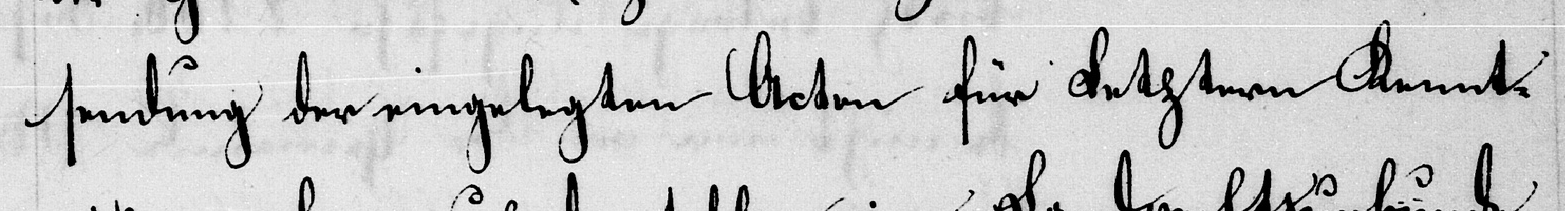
sendung der eingelegten Acten für letztern Kennt¬
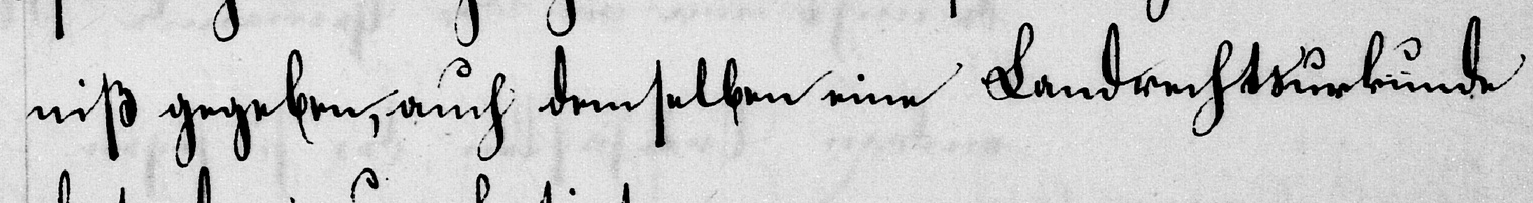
niß gegeben, auch demselben eine Landrechtsurkunde
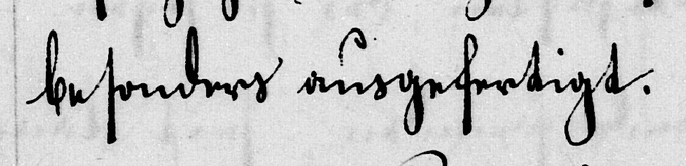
besonders ausgefertigt.
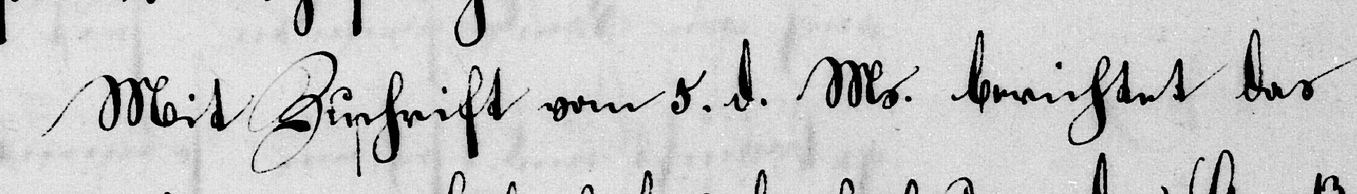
Mit Zuschrift vom 5. d. M. berichtet das
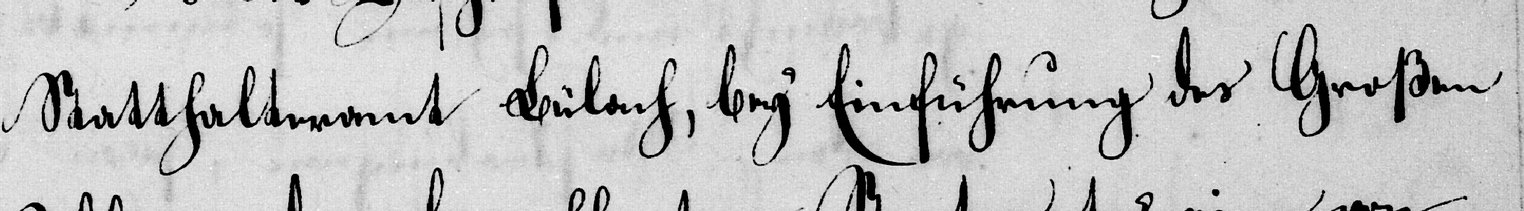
Statthalteramt Bülach, bey Einführung des Großen
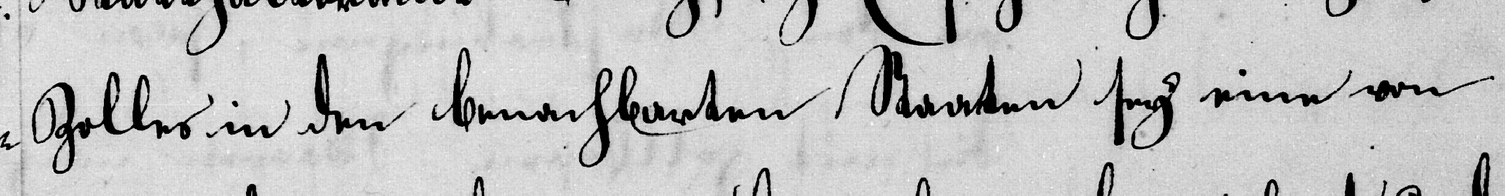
Zolles in den benachbarten Staaten sey eine von
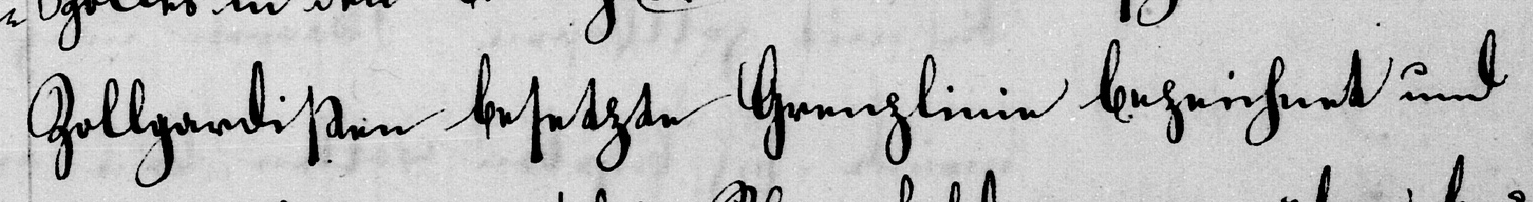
Zollgardisten besetzte Grenzlinie bezeichnet und
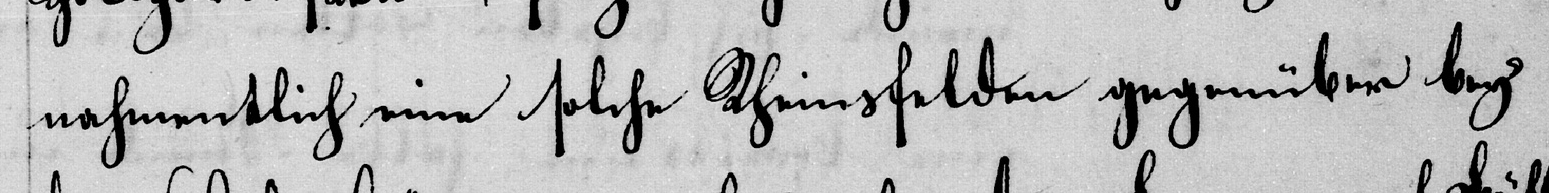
nahmentlich eine solche Rheinsfelden gegenüber bey
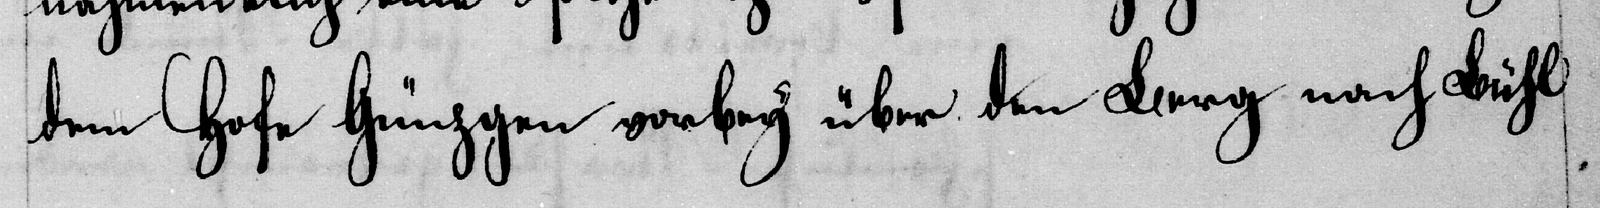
dem Hofe Günzgen vorbey über den Berg nach Bühl
